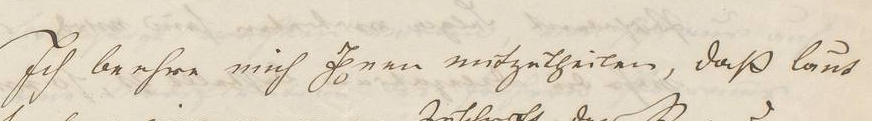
Ich beehre mich Ihnen mitzutheilen, daß laut
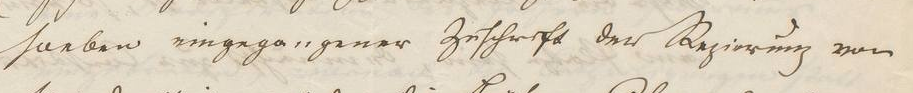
soeben eingegangener Zuschrift der Regierung von
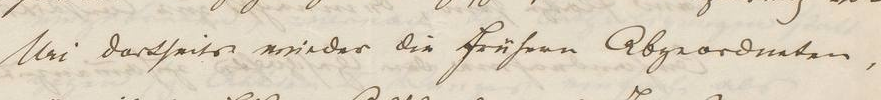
Uri dortseits wieder die frühern Abgeordneten,
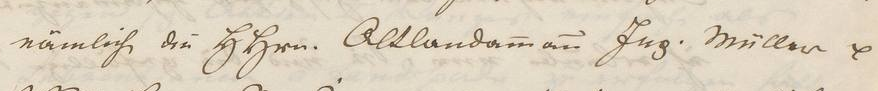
nämlich die HHrn. Altlandammann Ing. Müller &
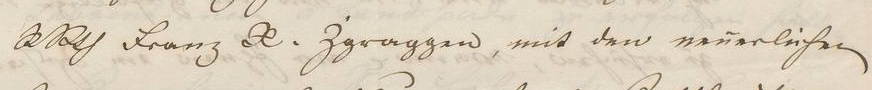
RRth Franz X. Z'graggen, mit den neuerlichen
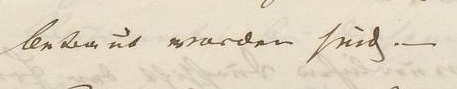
betraut worden sind. –
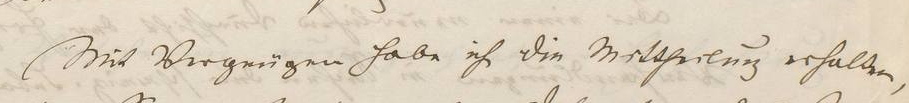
Mit Vergnügen habe ich die Mittheilung erhalten,
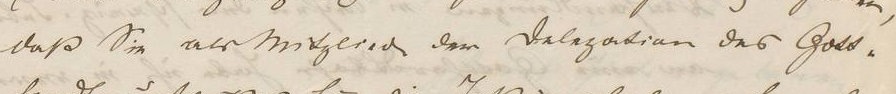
daß Sie als Mitglied der Delegation des Gott-
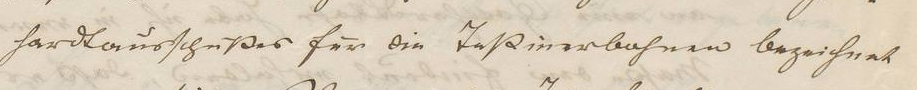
hardtausschußes für die Teßinerbahnen bezeichnet
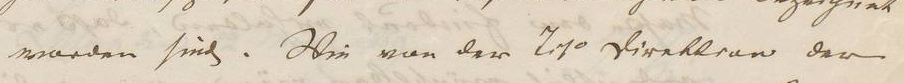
worden sind. Wie man der Tito Direktion der
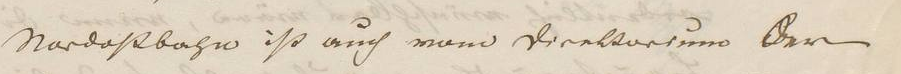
Nordostbahn ist auch vom Direktorium der
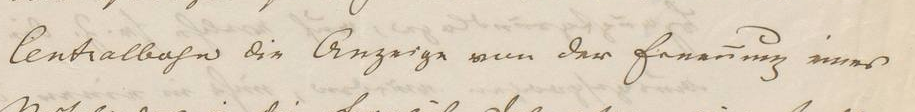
Centralbahn die Anzeige von der Ernennung eines
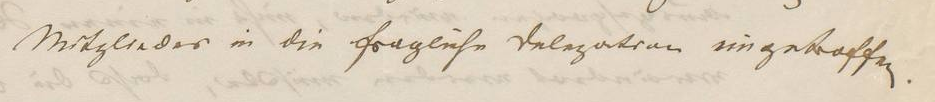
Mitgliedes in die fragliche Delegation eingetroffen.
